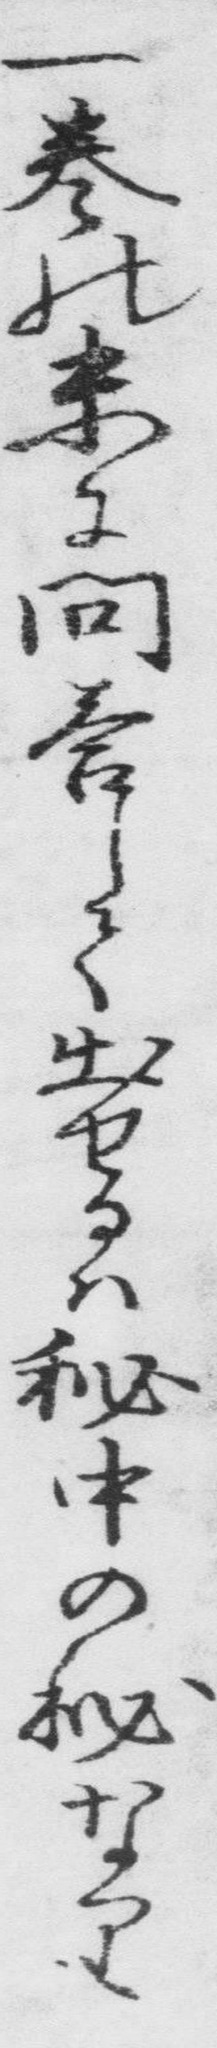一巻の末に問答して出せるは秘中の秘なり
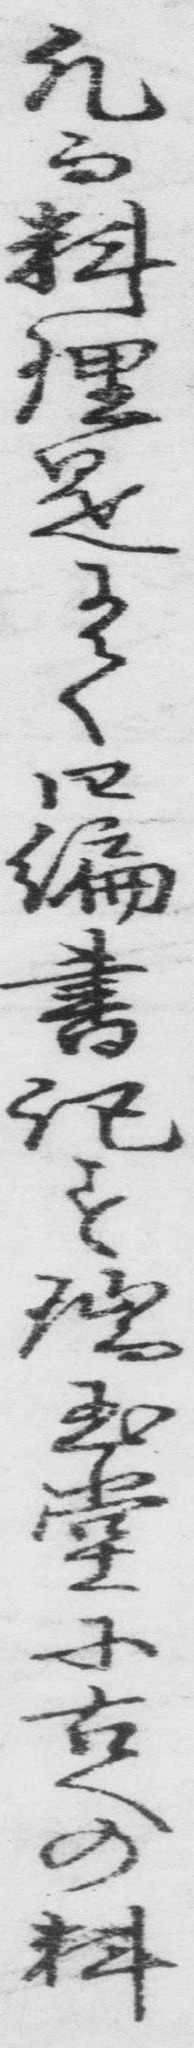凡而料理是よく四編書記す瑞玉堂に古への料
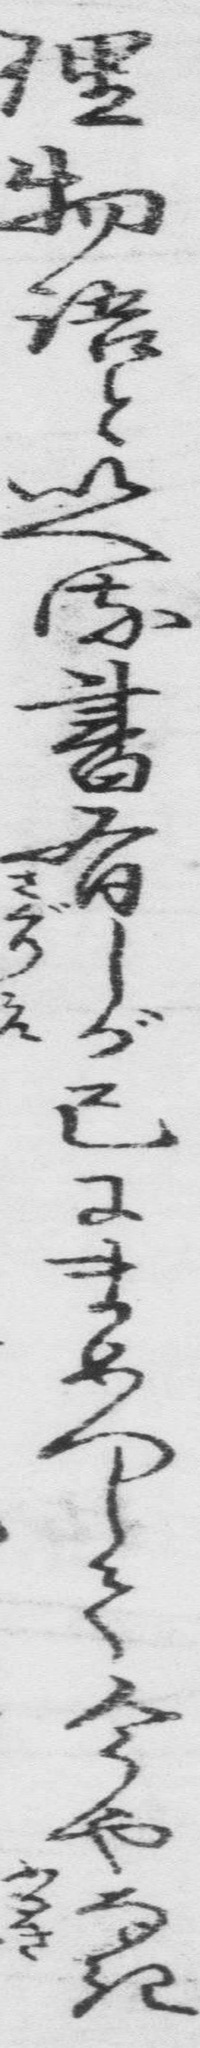理物語といへる書有しが已にまめつして今やなき
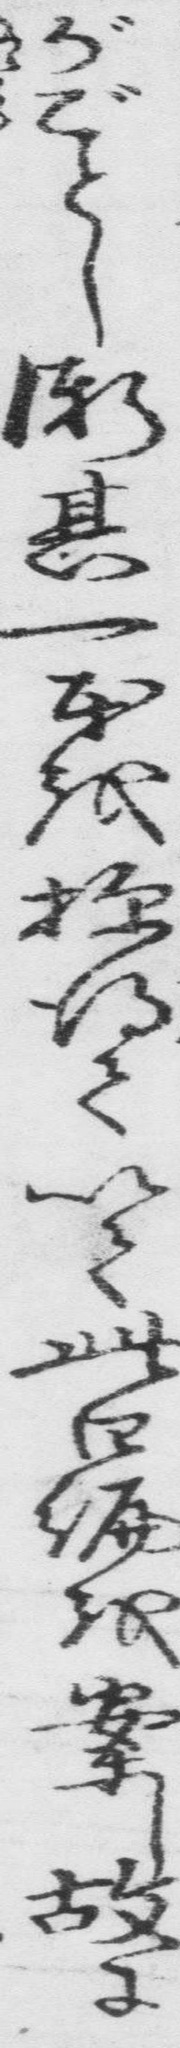がごとし漸一本を探得て以て此四編を案し故に
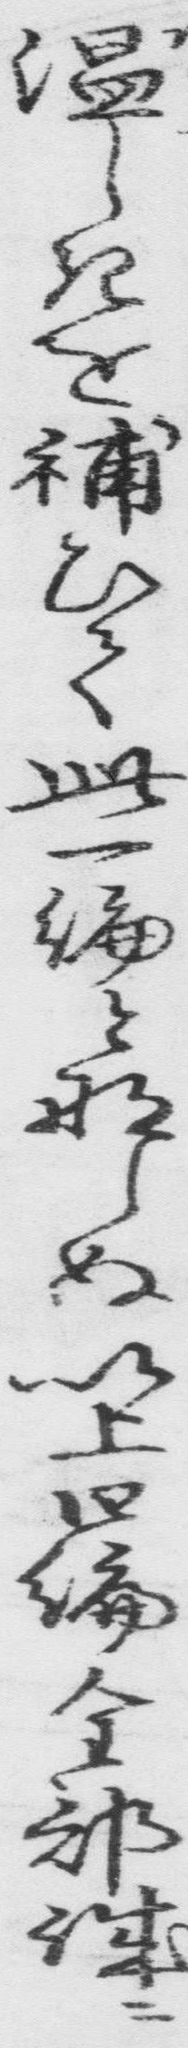温しきを補ひて此一編となしぬ以上四編全部徳に
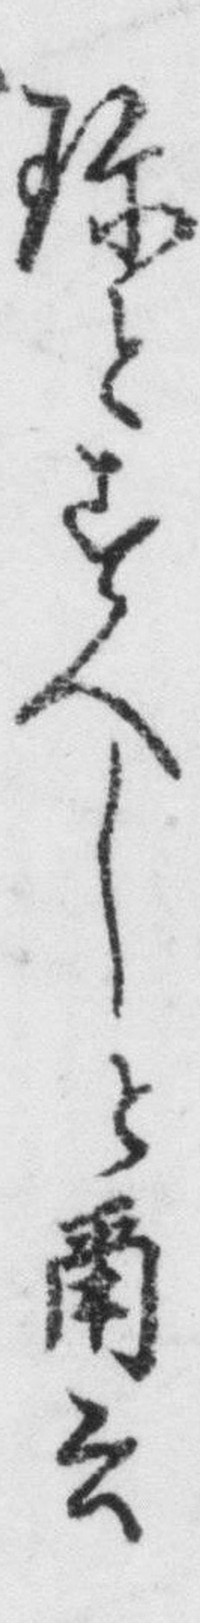珍とすへしと爾云
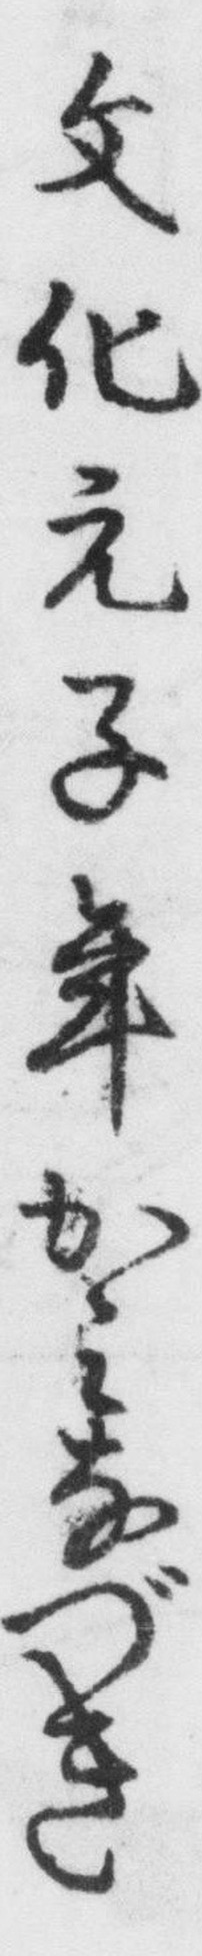文化元子年かみなづき
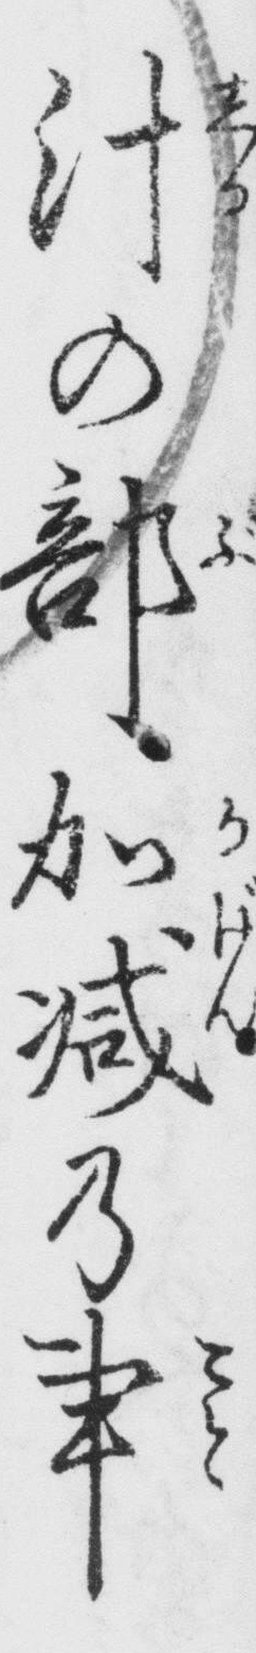汁の部加減の事
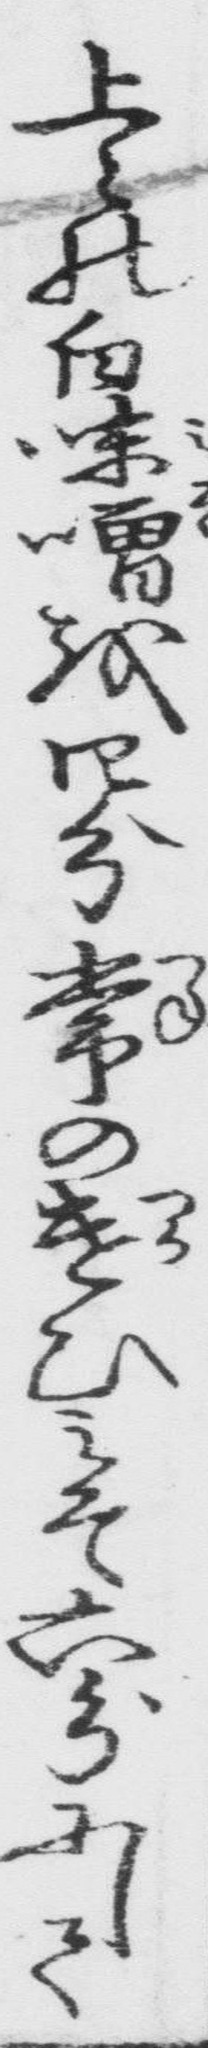上々の白味噌を四部常の遣ひみそ六分にして
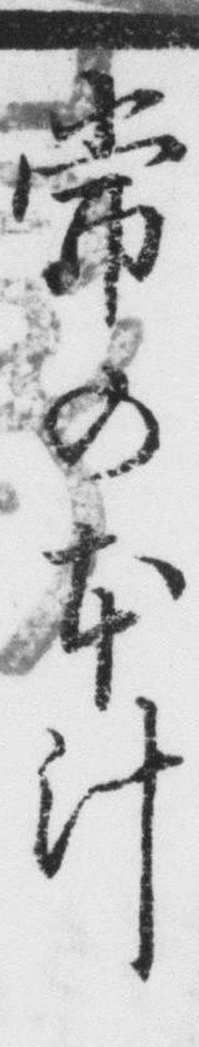常の本汁
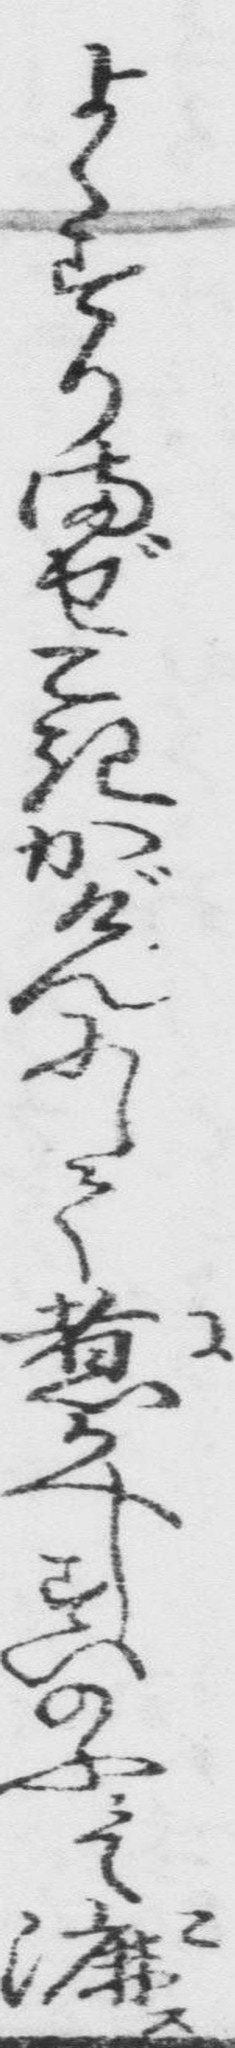よくすりまぜこきかげんにして煮かへしすいのふにて漉す
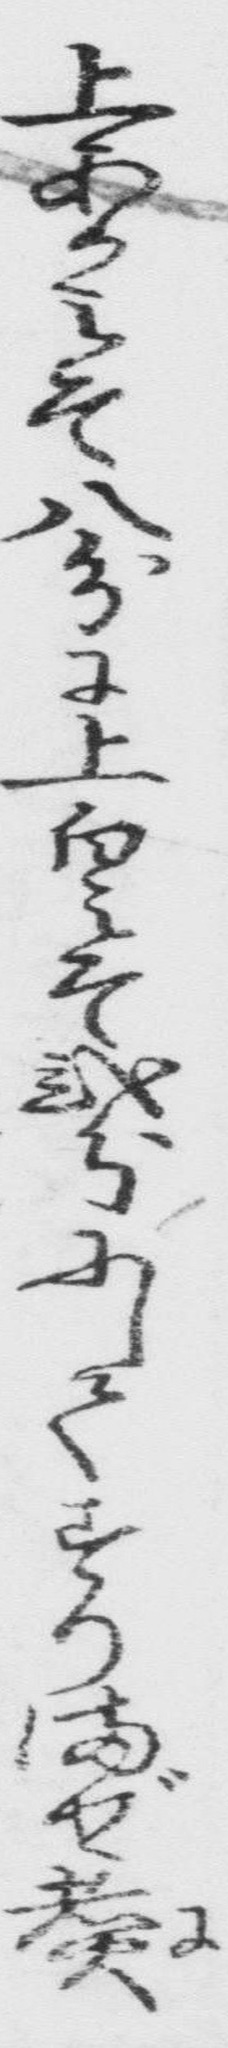上あかみそ八分に上白みそ弐分にしてすりまぜ煮
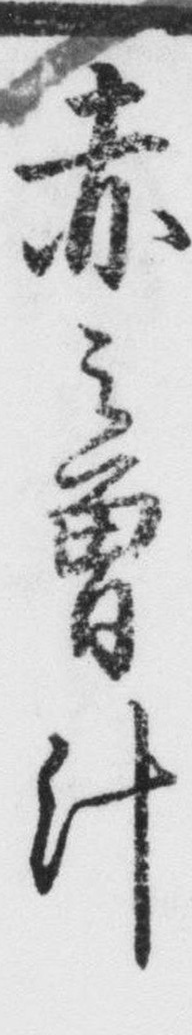赤み曽汁
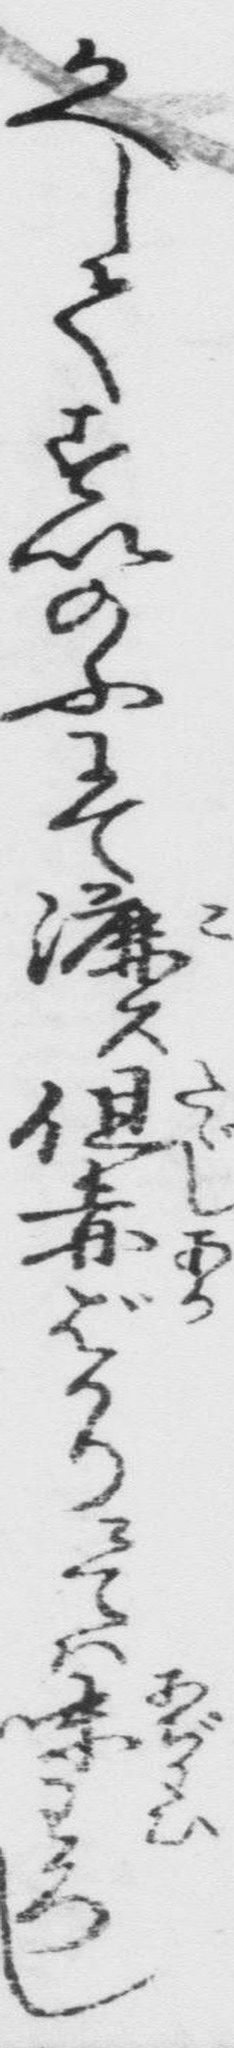かへしてすいのふにて漉す但赤ばかりにては味わろし
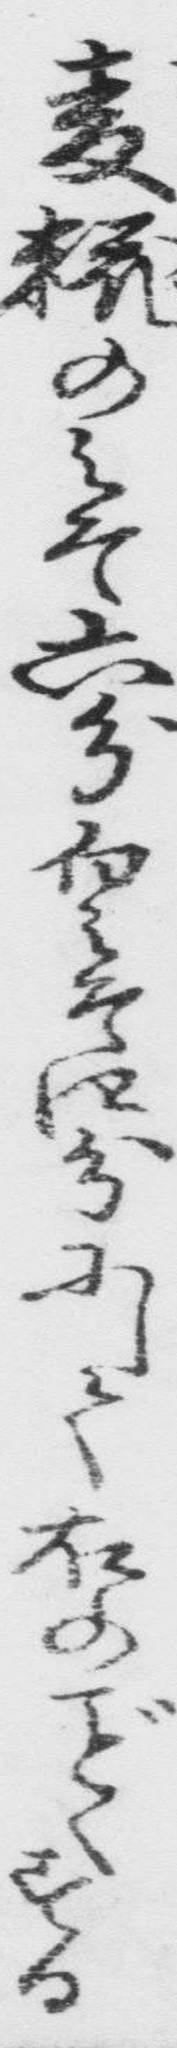麦糀のみそ六分白みそ四分にして右のごとくする
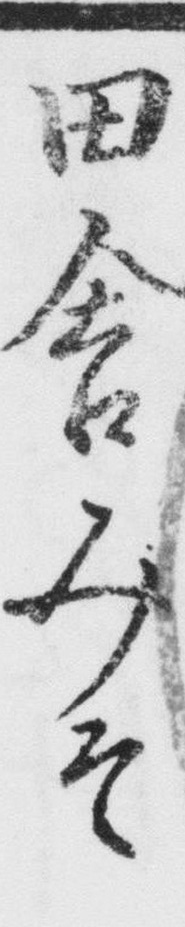田舎みそ
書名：料理早指南
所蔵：大阪府立大学学術情報センター 国文学研究資料館
